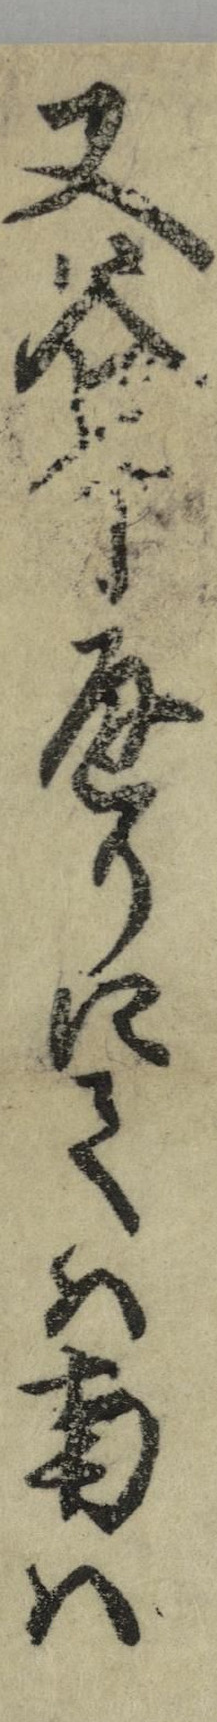又谷丁通りにては南は
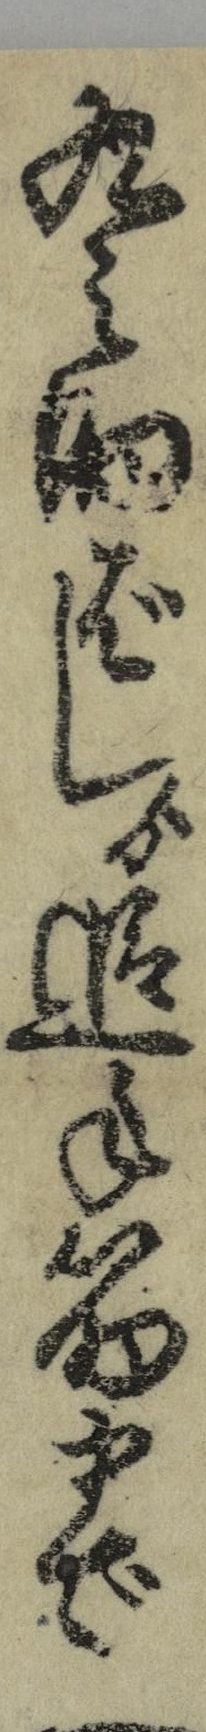九ノ助ばしゟ追手筋まで
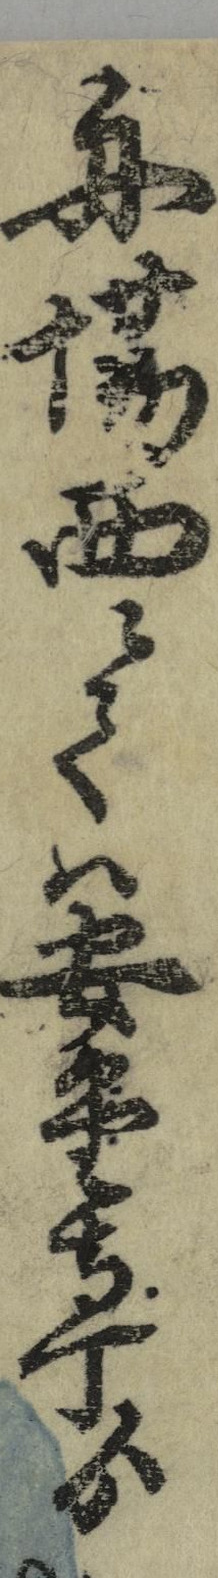舟場西にては安堂寺町ゟ
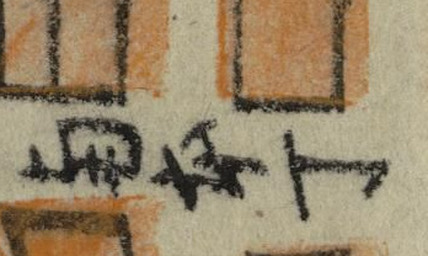上本丁
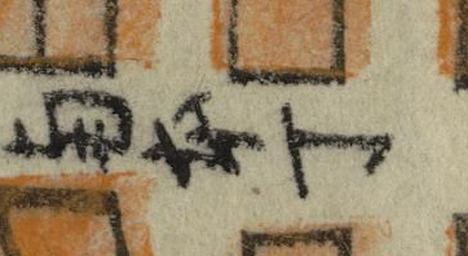上本丁
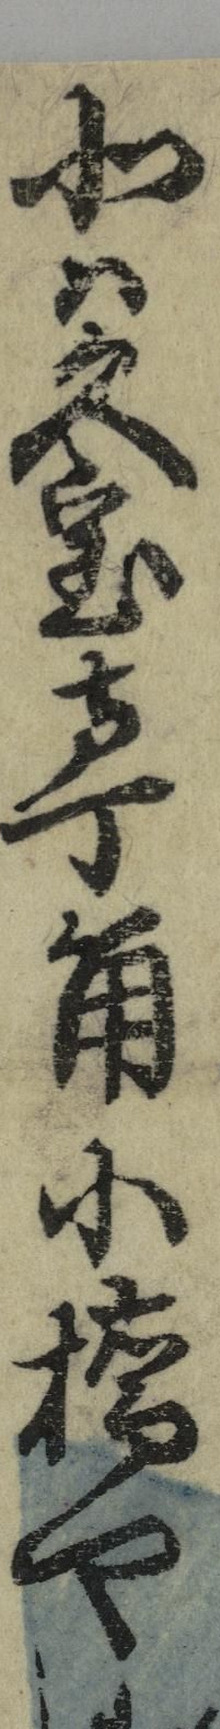北は久宝寺丁角小橋や
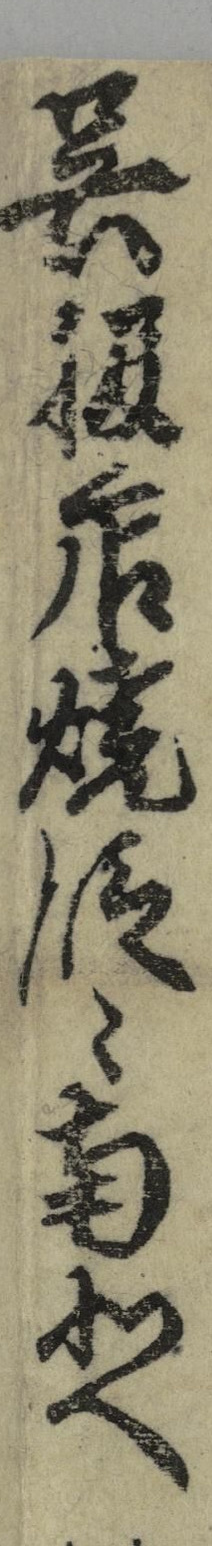呉服店焼段々南北へ
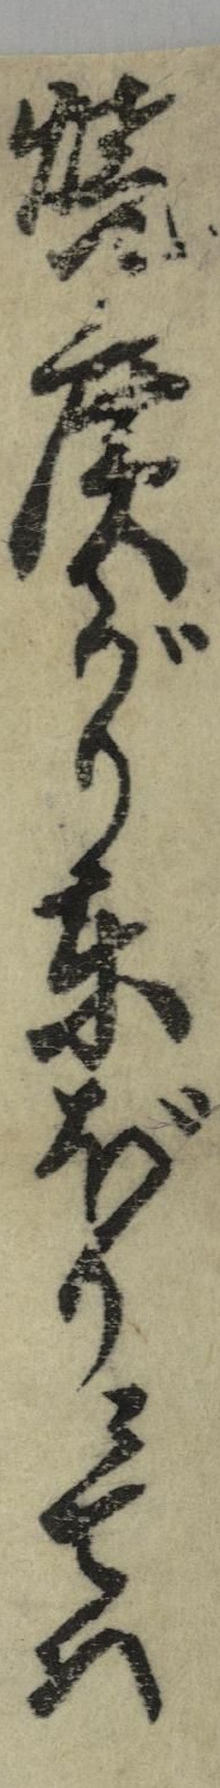焼広がり東ぼりにては
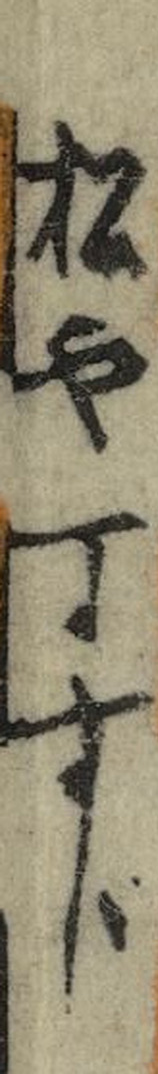松や丁すじ
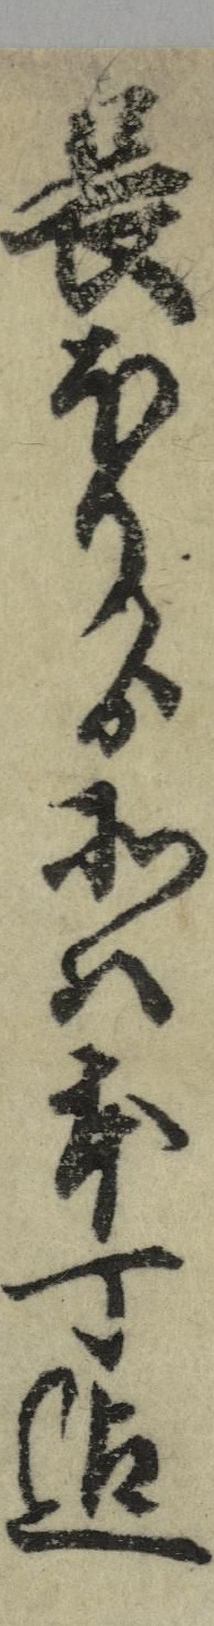長ほりゟ北は本丁迄
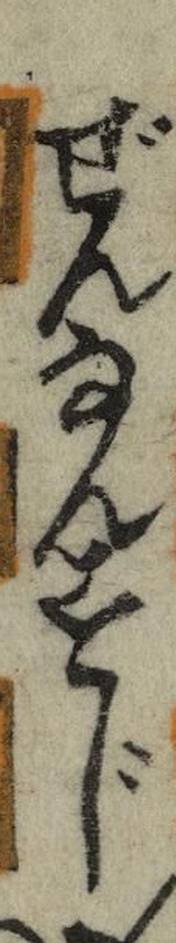同ぜんなんすじ
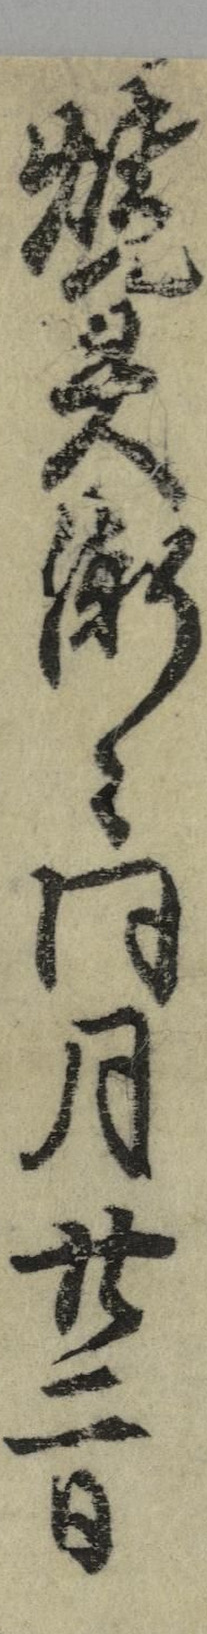焼失漸〻同月廿ニ日
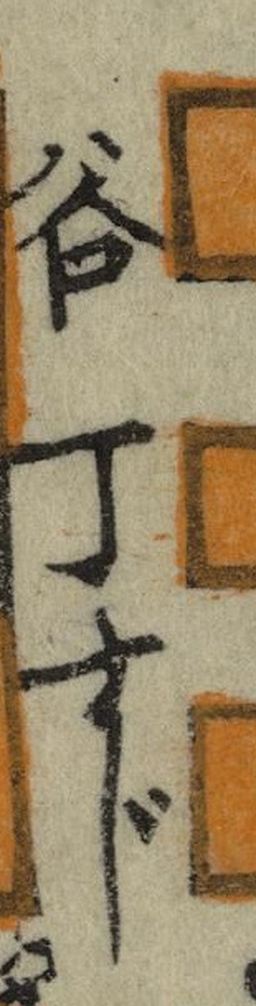谷丁すじ
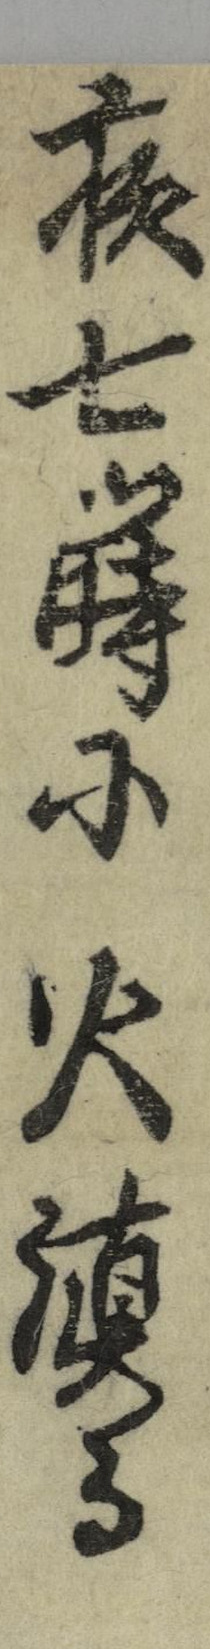夜七ツ時に火鎮る
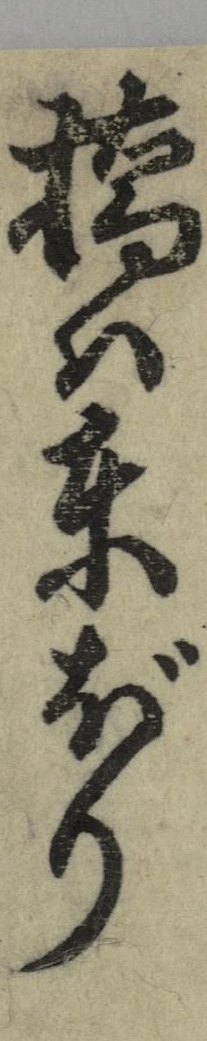橋は東ぼり
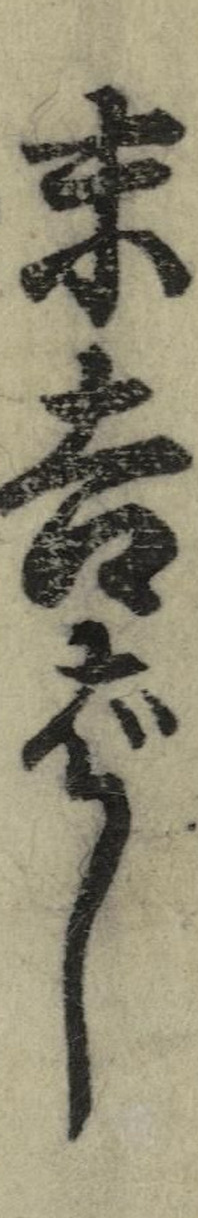末吉ばし
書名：大坂大火本しらべ
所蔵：東京大学地震研究所図書室 Earthquake Research Institute Library, The University of Tokyo, JAPAN
